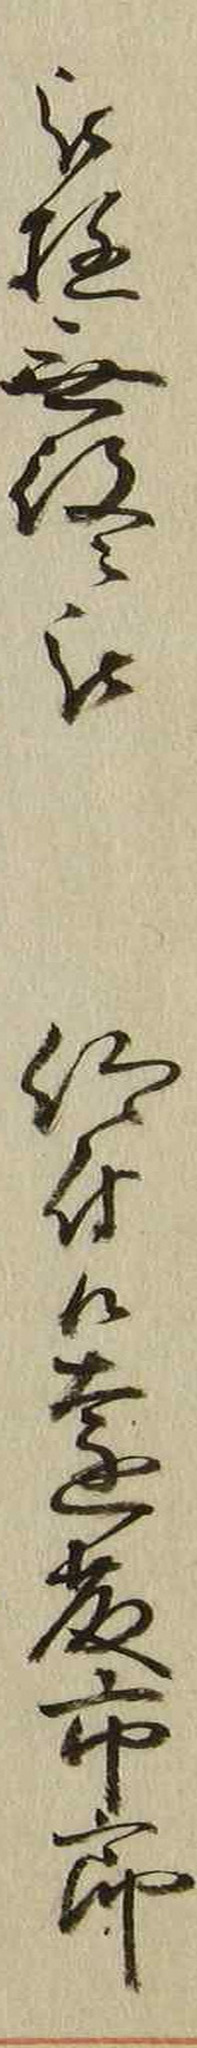被遊無役ニ被仰付候遠藤市郎
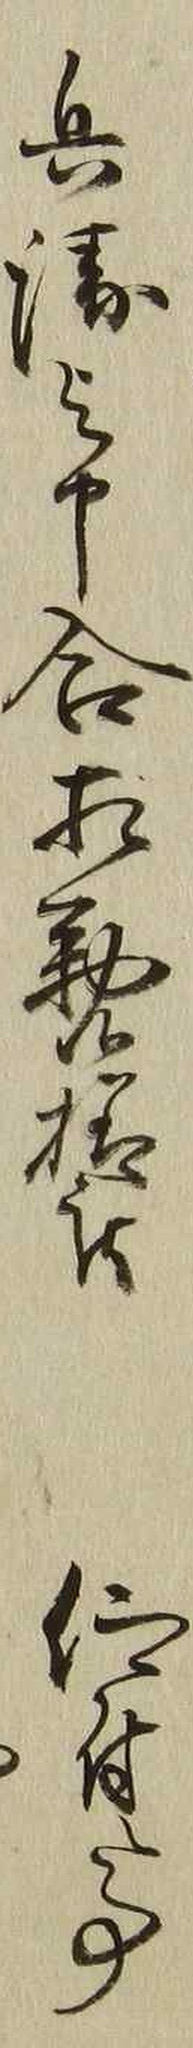兵衛与申合相勤候様被仰付候事
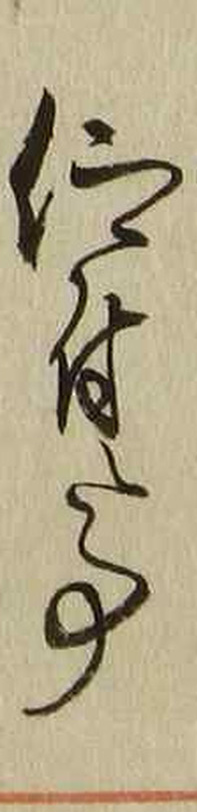仰付候事
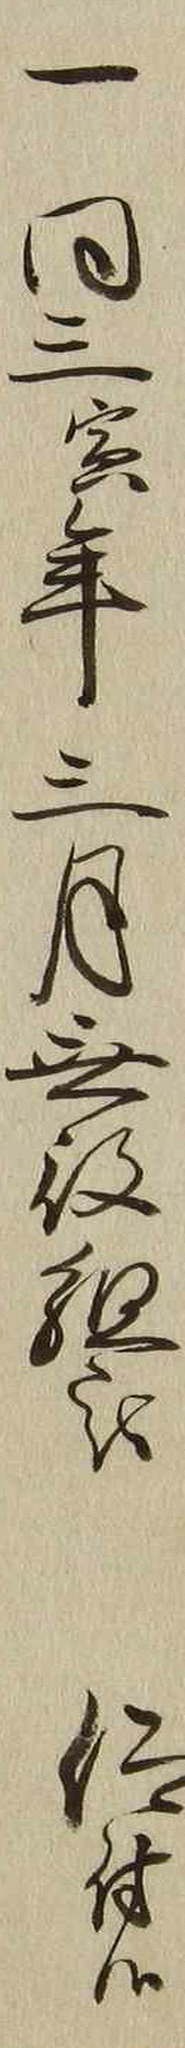一同三寅年三月無役組被仰付候
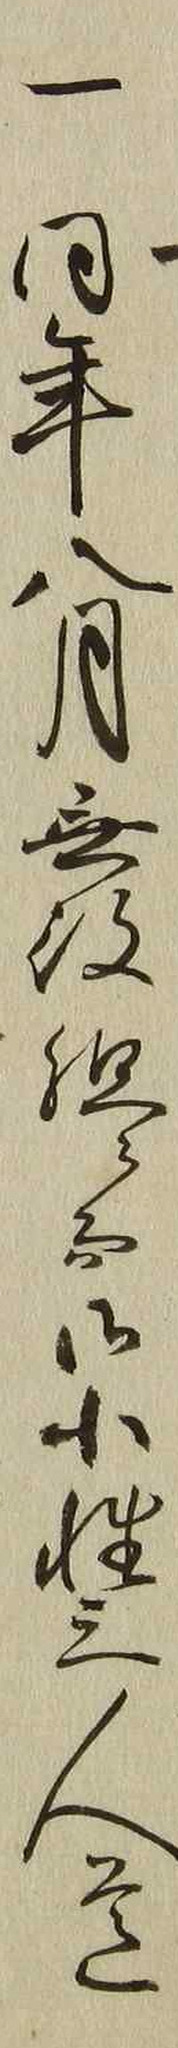一同年八月無役組ニ而御小性三人道
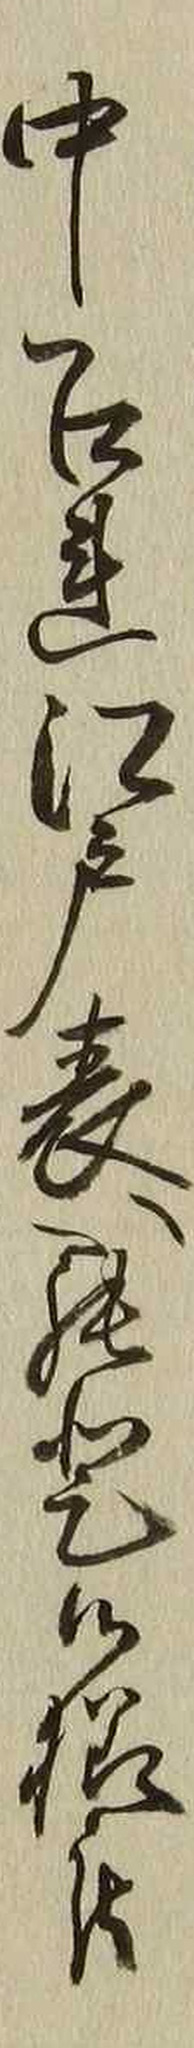中召連江戸表へ罷登候様被
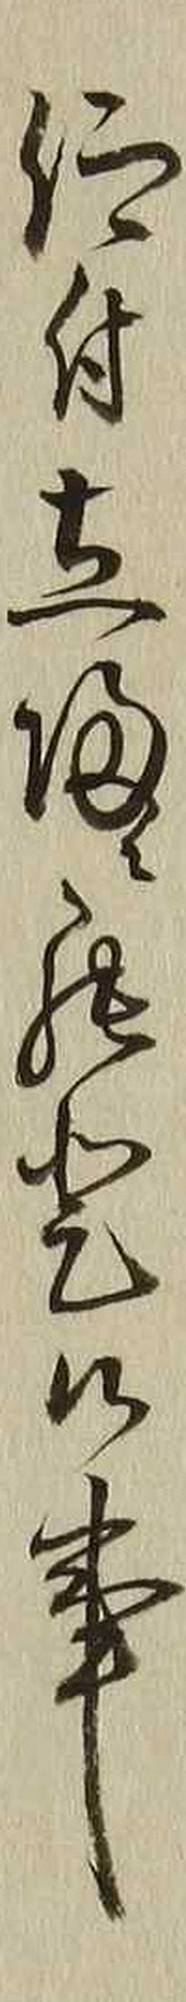仰付立帰ニ罷登候事
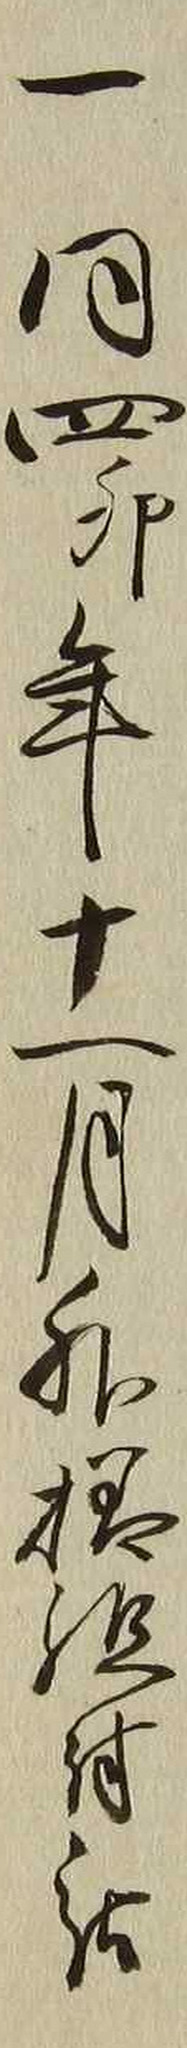一同四卯年十一月外様組付被
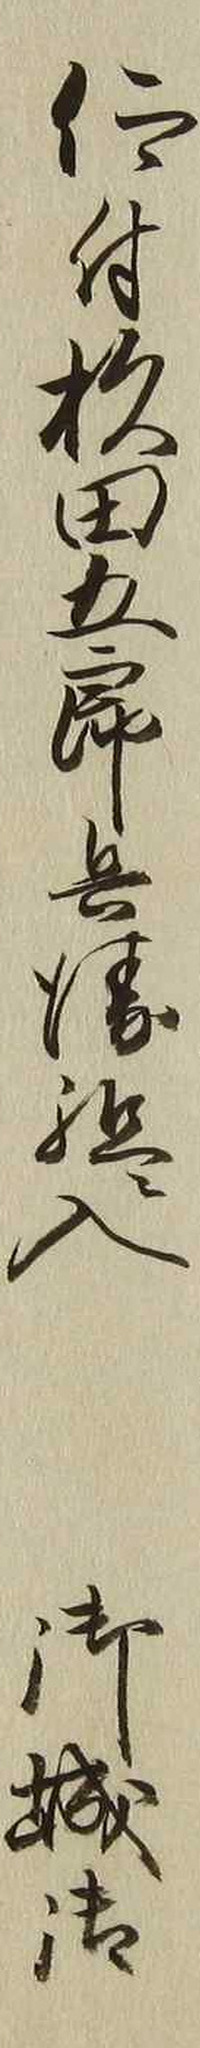仰付杉田五郎兵衛組ニ入御城御
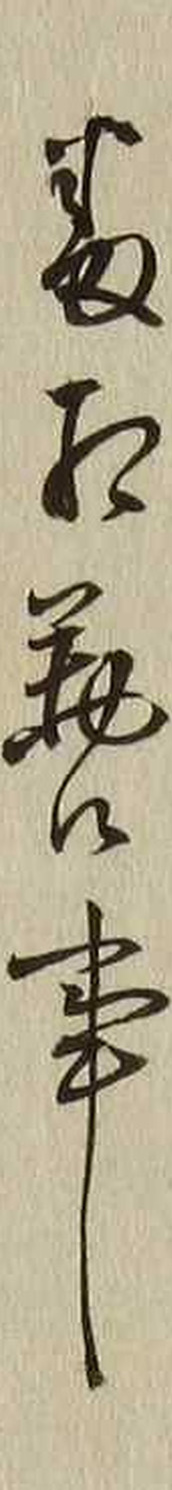番相勤候事
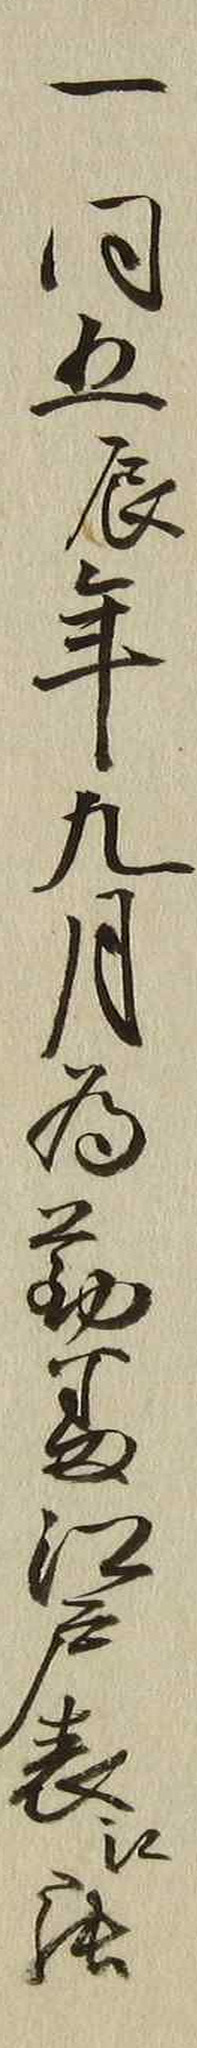一同五辰年九月為勤番江戸表江罷
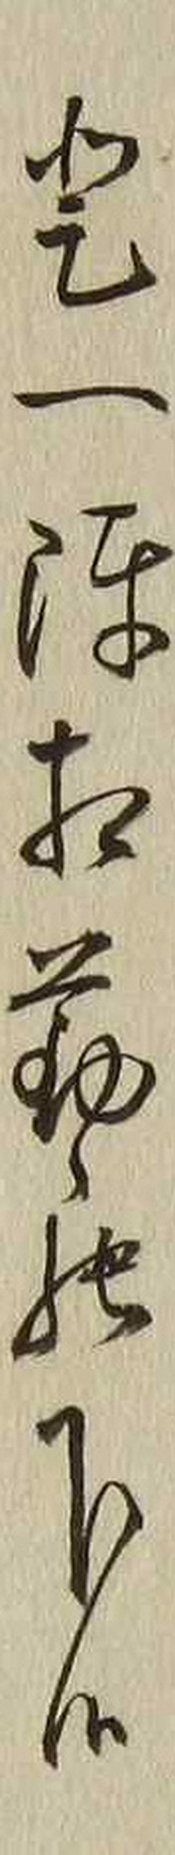登一陣相勤罷下候
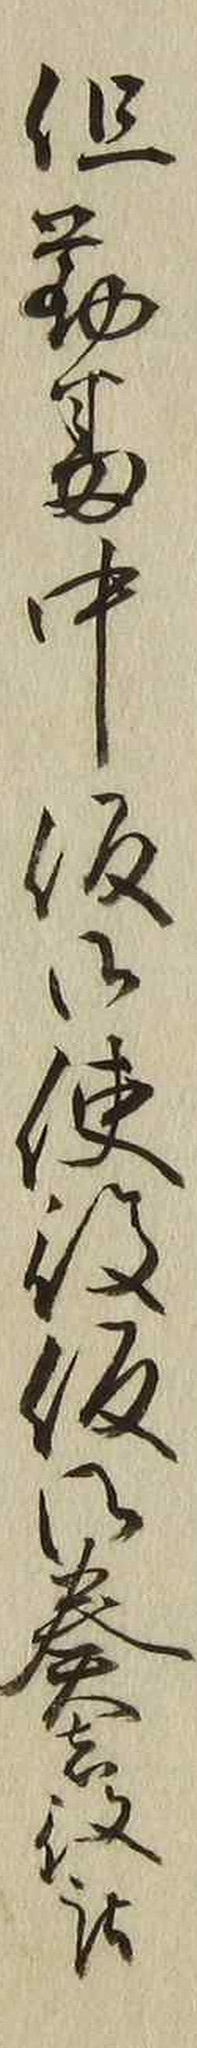但勤番中仮御使役仮御奏者役被
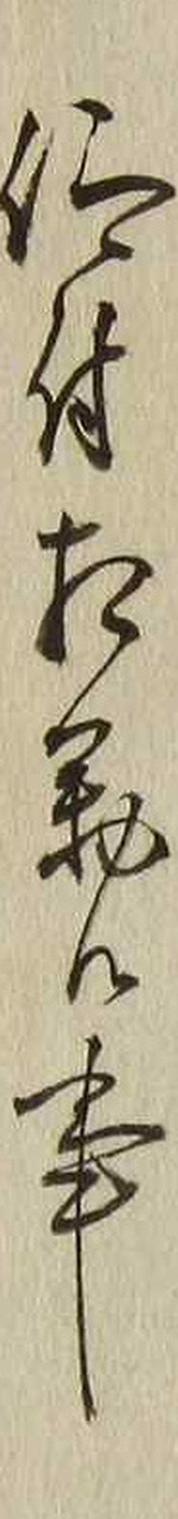仰付相勤候事
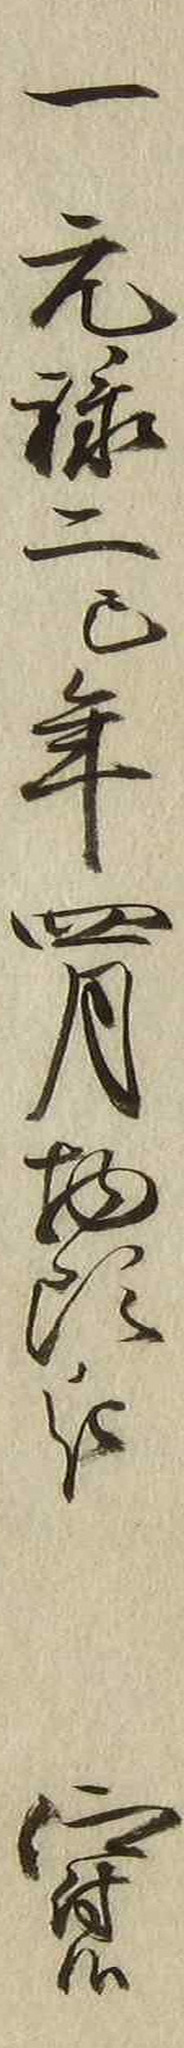一元禄二巳年四月物頭被仰付候
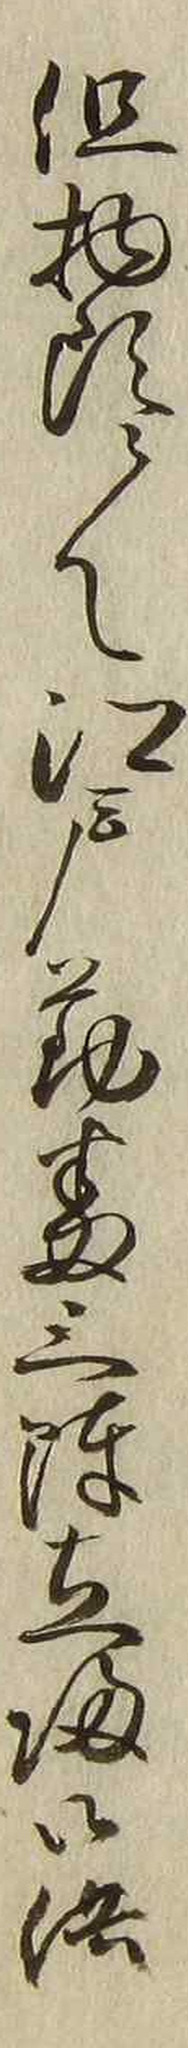但物頭ニて江戸勤番三陣立帰御供
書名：諸士系譜　巻之60　と之部3
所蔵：会津若松市立会津図書館
